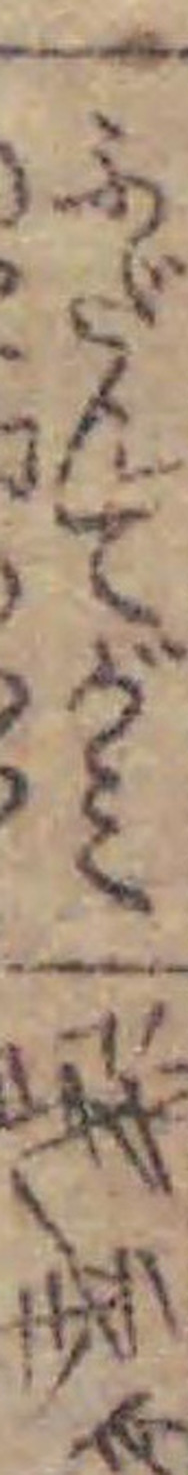ふだんてがみ
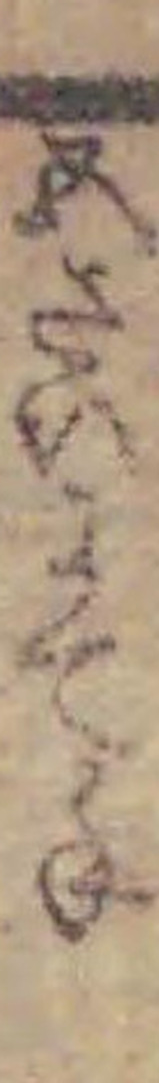五さいにて手
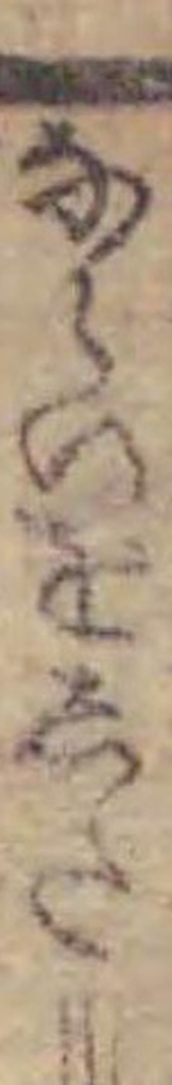ならいをした
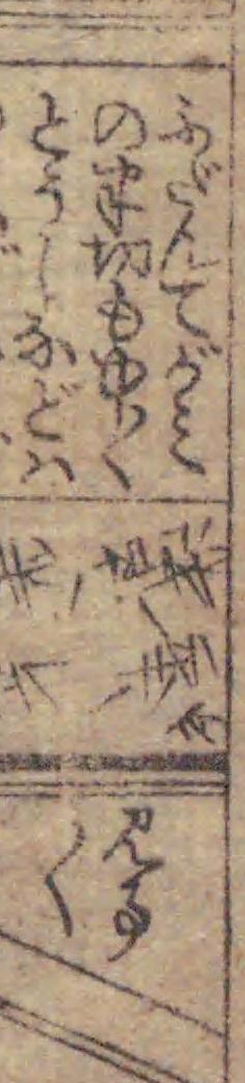の半切も中〳〵
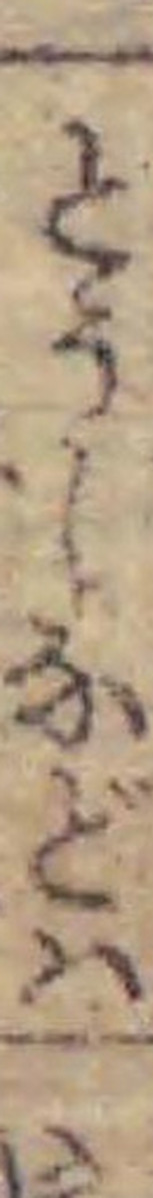とうしなどは
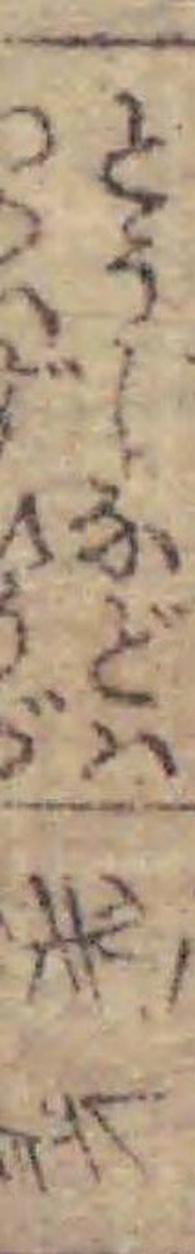とうしなどは
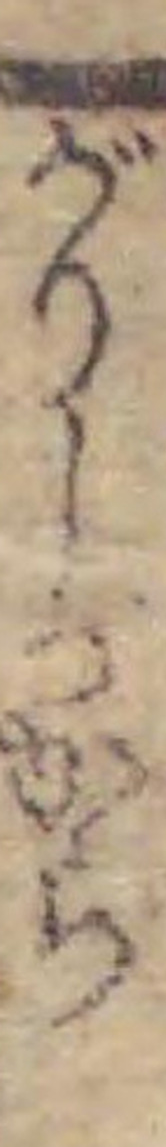がりしがから
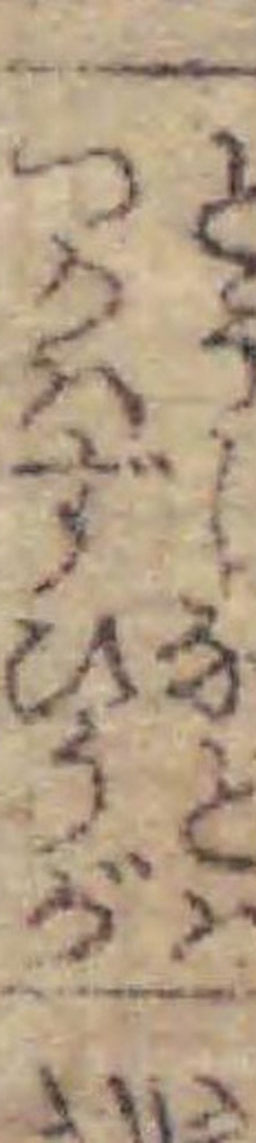つかはずひうが
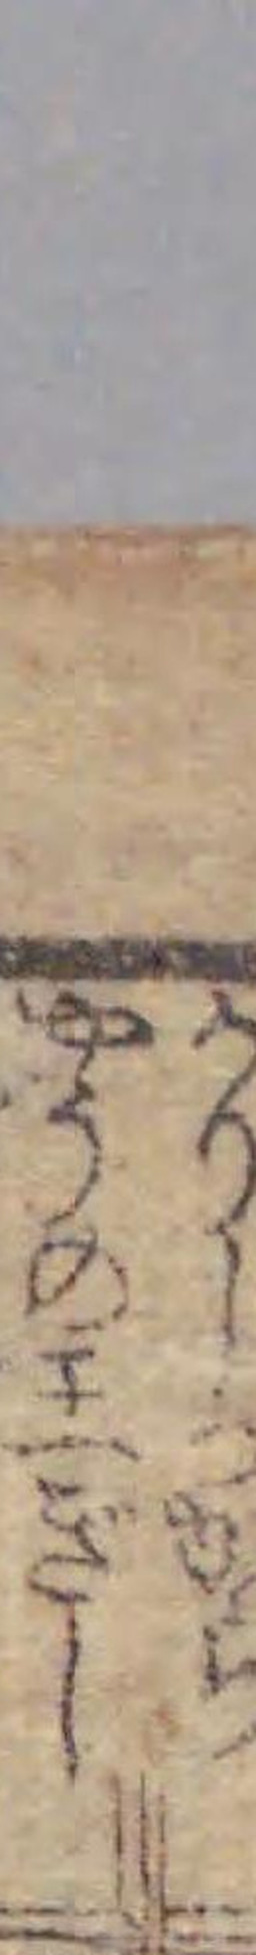やうの王ぎし
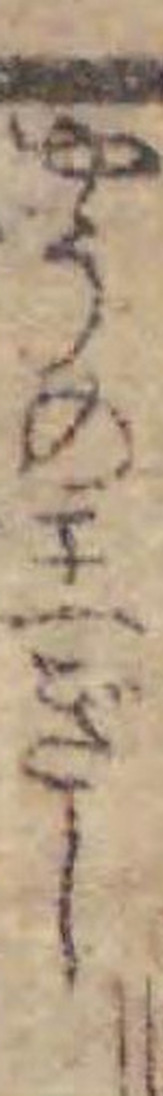やうの王ぎし
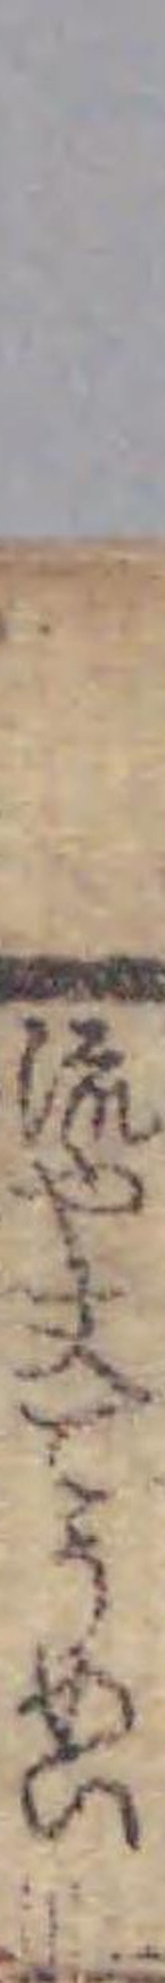流や丈てうめい
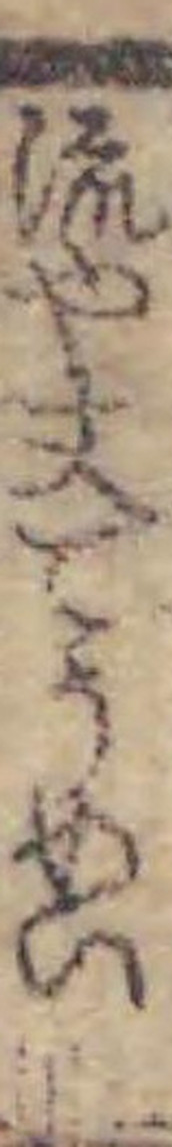流や丈てうめい
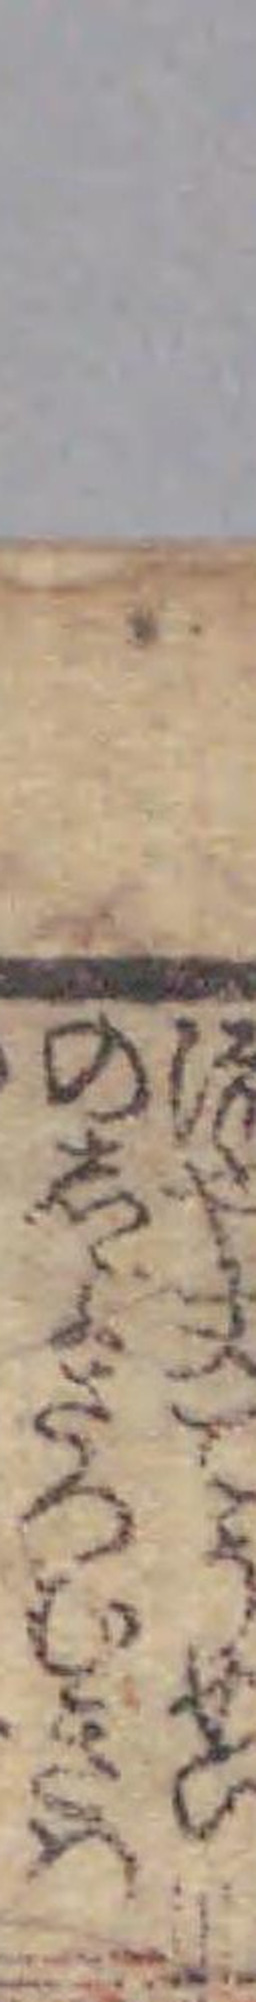のしよさつむきは
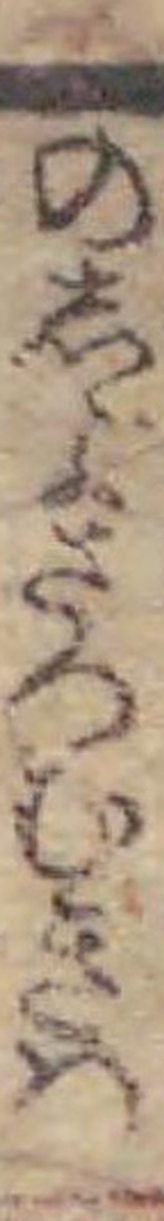のしよさつむきは
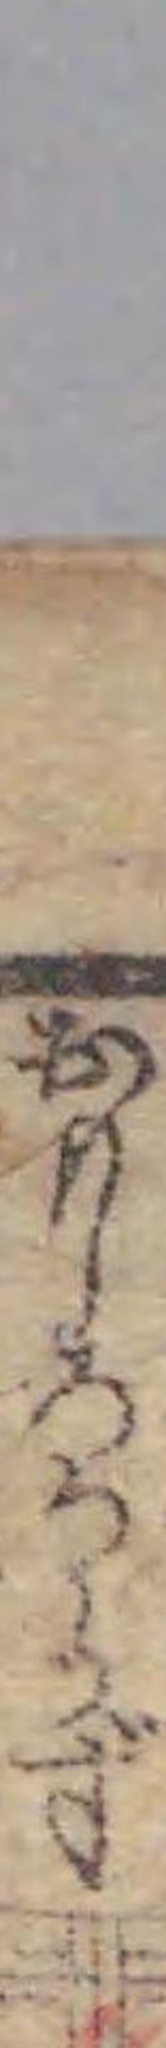おもしろからず
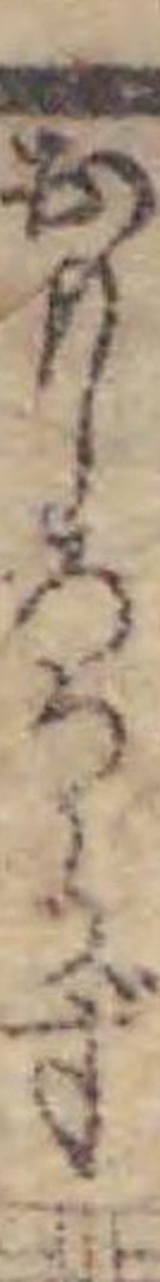おもしろからず
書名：此奴和日本 : 2巻
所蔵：国立国会図書館 National Diet Library, JAPAN
